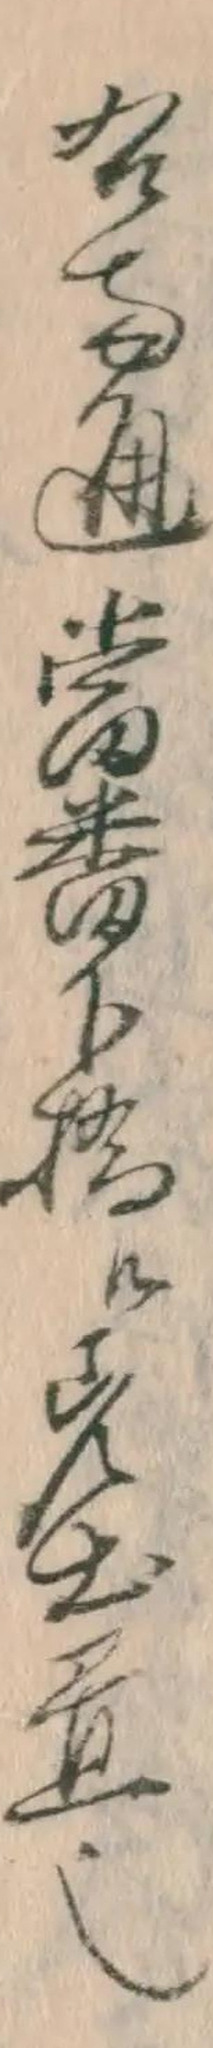右両通當番下橋え差出置也
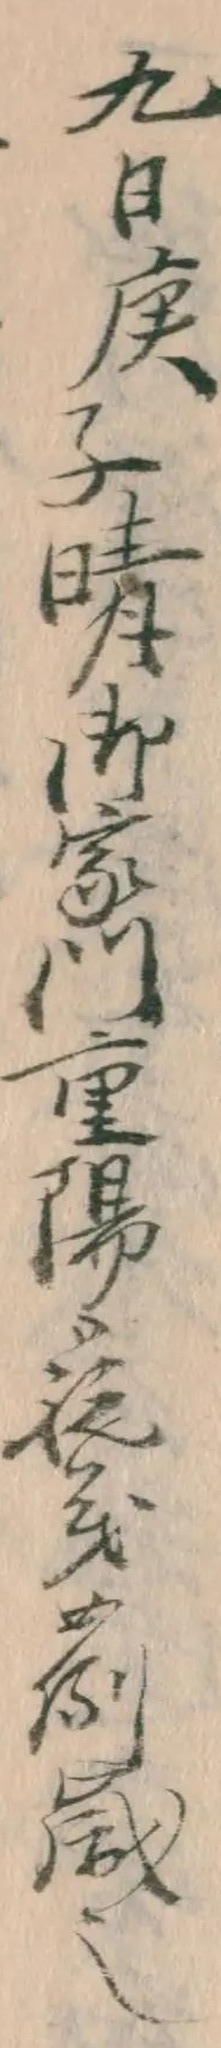九日庚子晴御家門重陽御祝義如例歳也
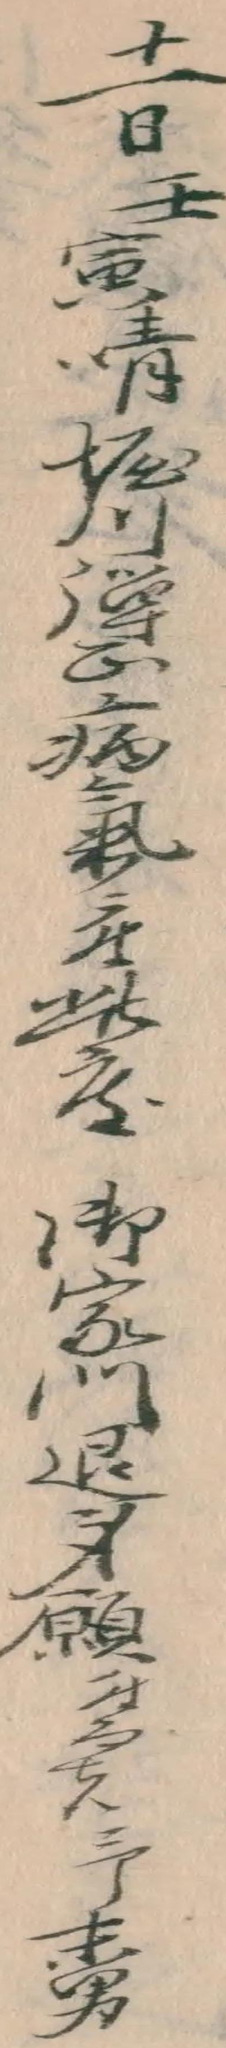十一日壬寅晴堀川弾正病氣ニ付此度御家門退身願付而は予未男
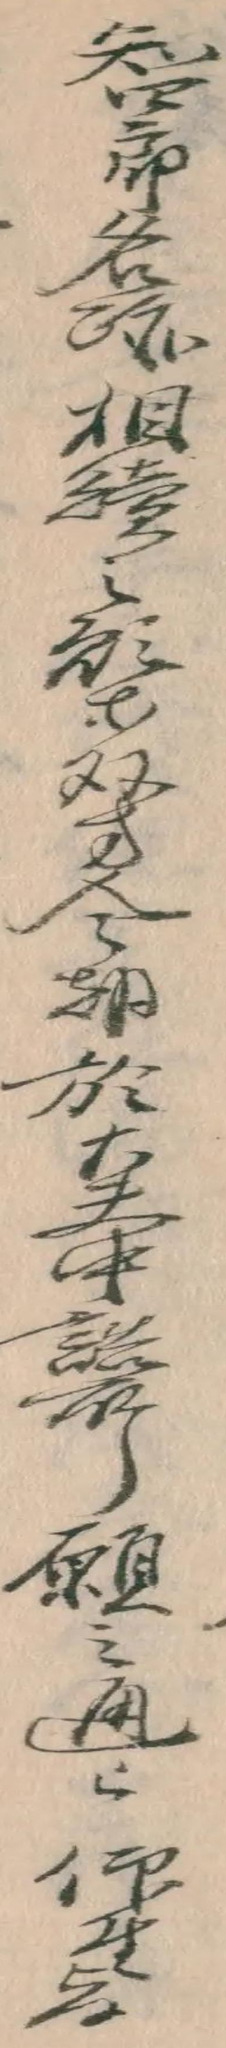知四郎名跡相續之願等双方人之都於大夫中詰所願之通被仰付旨
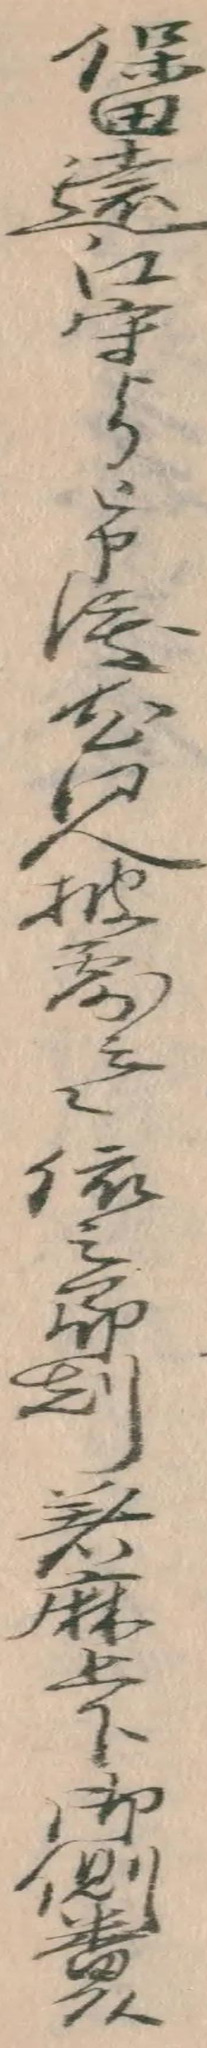保田遠江守より被申渡尤同人披露云々依之即刻着麻上下御側番頭
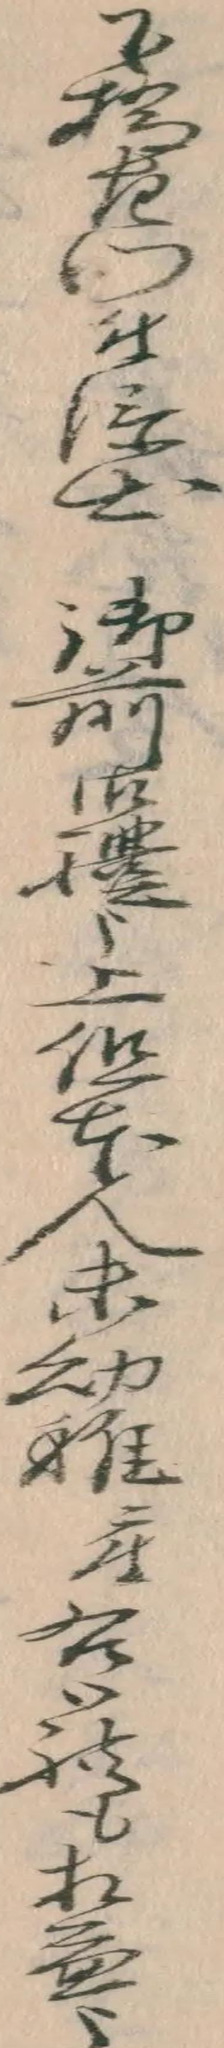下橋左門被添出御前御禮之上但本人未幼稚ニ付右御礼も相兼候
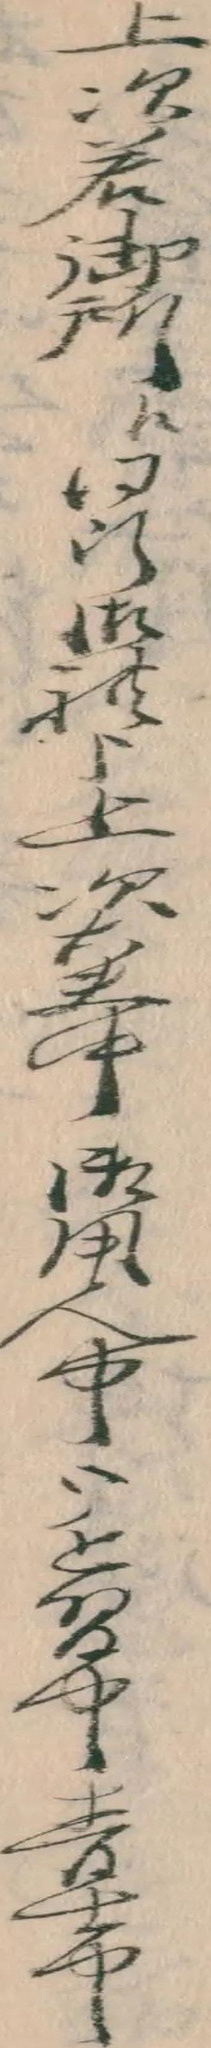上次若御所江同断御礼申上次第御用人中御近習中青士中
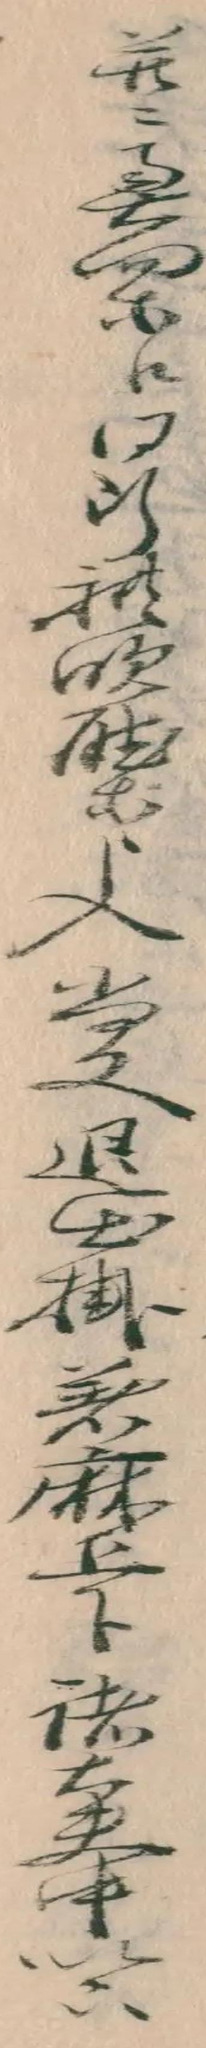并ニ奥向所え同断被吹聴等申入尚又退出掛着麻上下諸大夫中以下
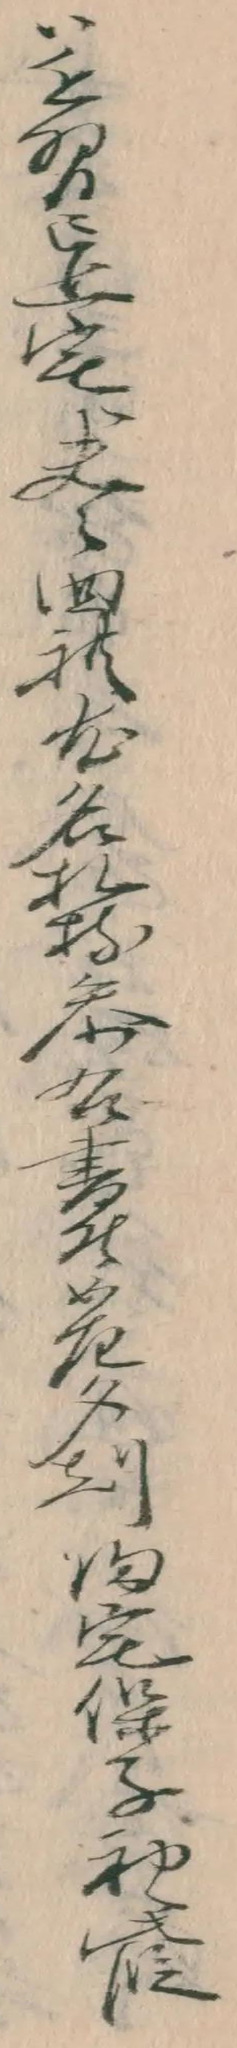ハ近習已上宅へ夫々回礼尤名札持参右書付如左夕刻帰宅保子初此段
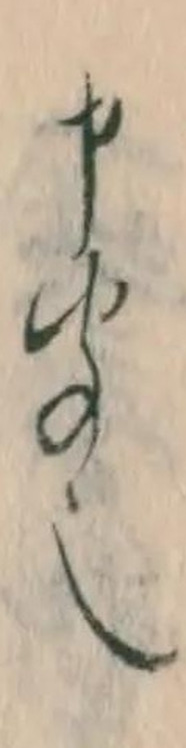申聞也
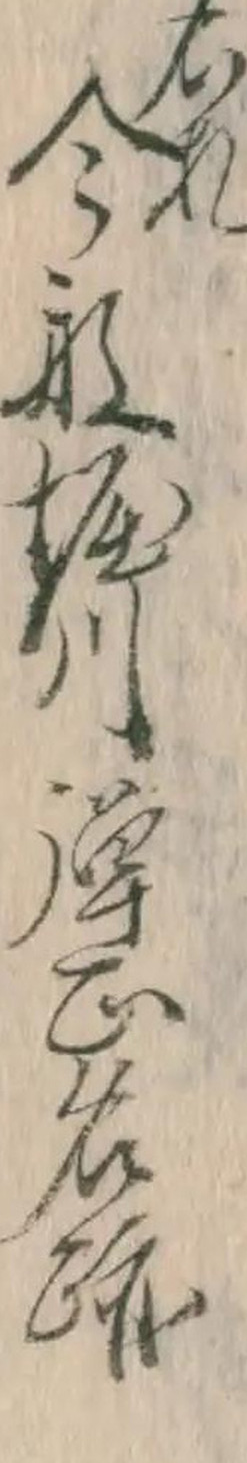今般堀川弾正名跡
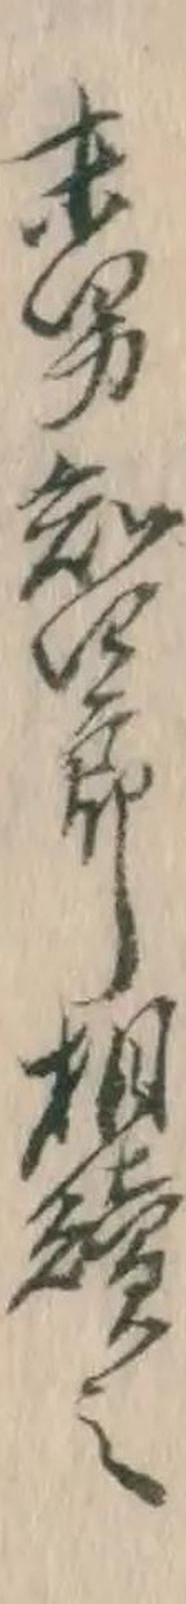末男知四郎相続之
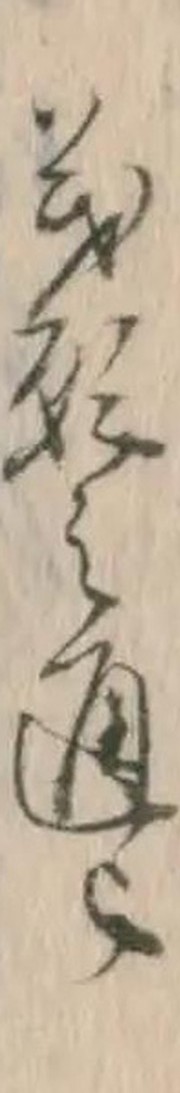義願之通被
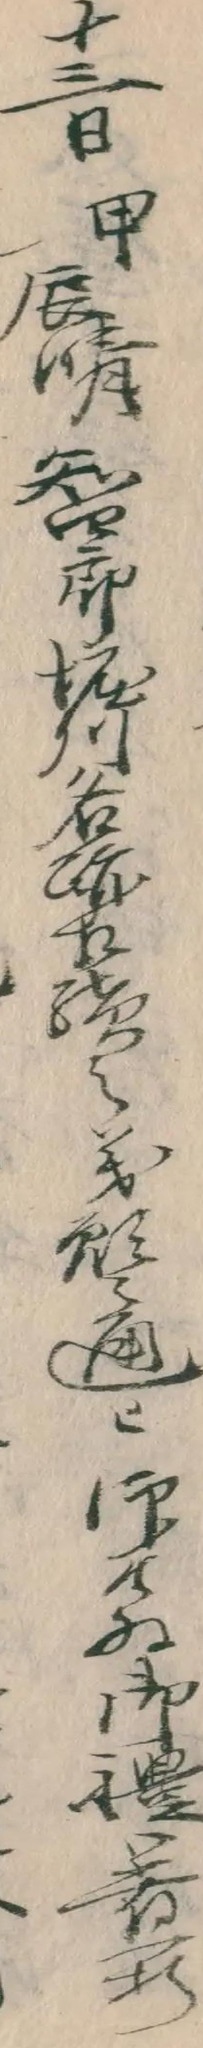十三日甲辰晴知四郎堀川名跡相続之義願之通被仰被為御禮御肴新
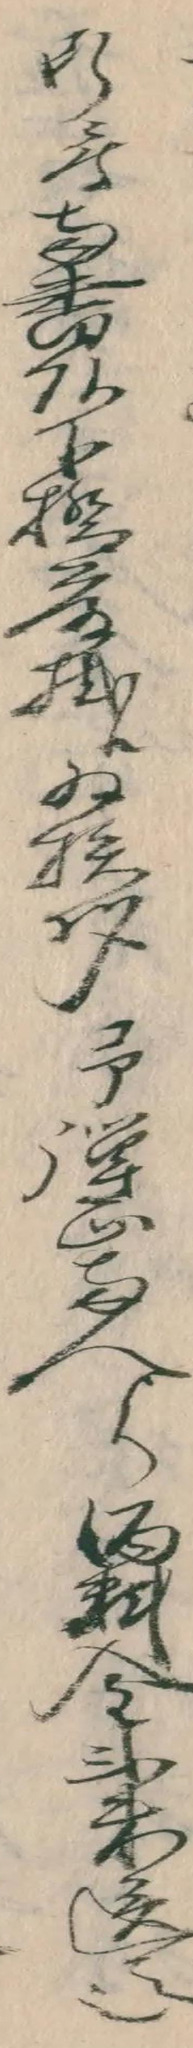断ニ付両番頭下橋藤掛江為挨拶予弾正両人より酒料金弐朱送候也
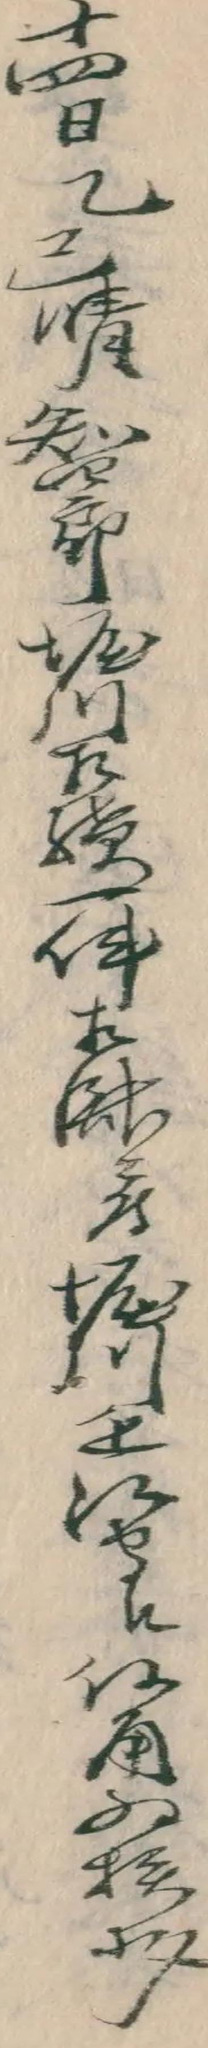十四日乙巳晴知四郎堀川相続一件相済ニ付堀川近江守江何角為挨拶
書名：賀茂社記録. 第65冊
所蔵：国立国会図書館 National Diet Library, JAPAN
